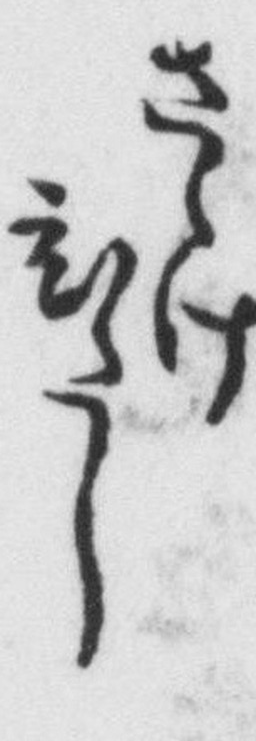ひたし
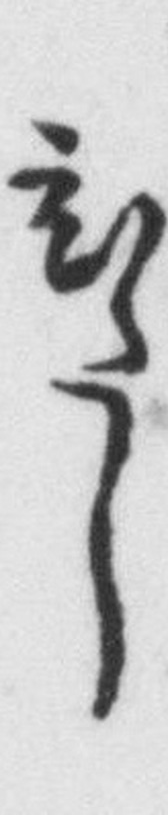ひたし
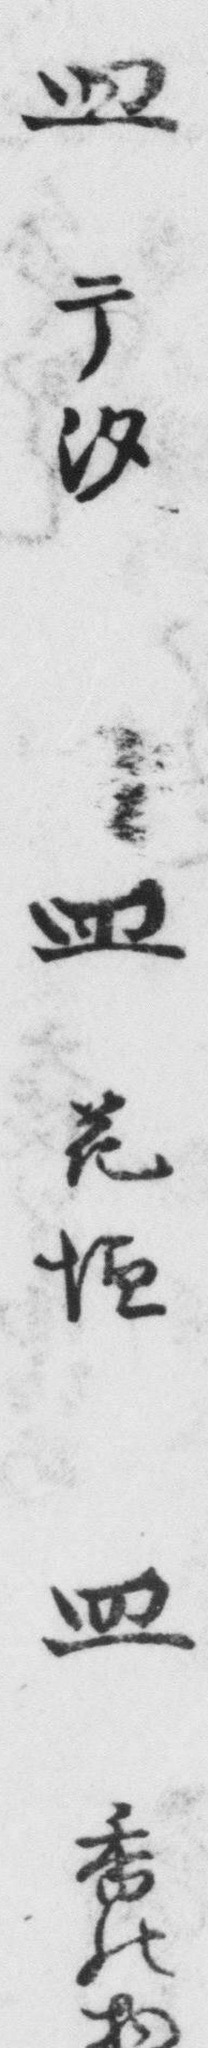皿干汐皿花塩皿香の物
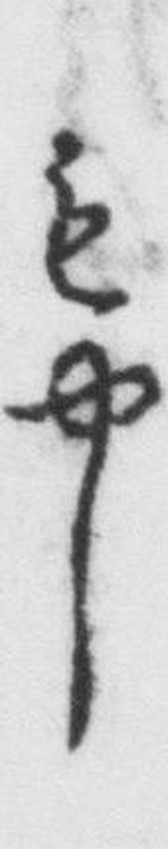もやし
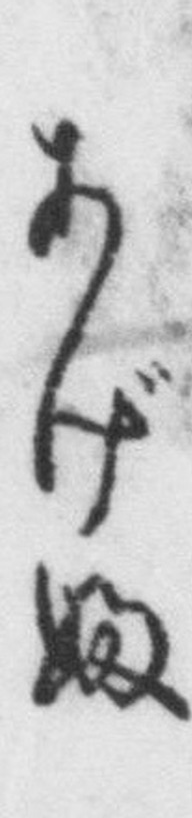あげふ

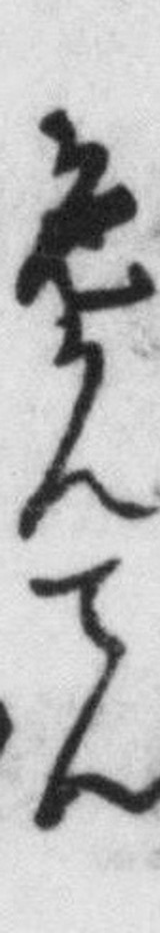色かんてん
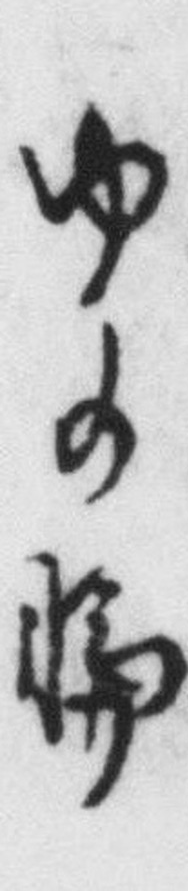ゆの輪
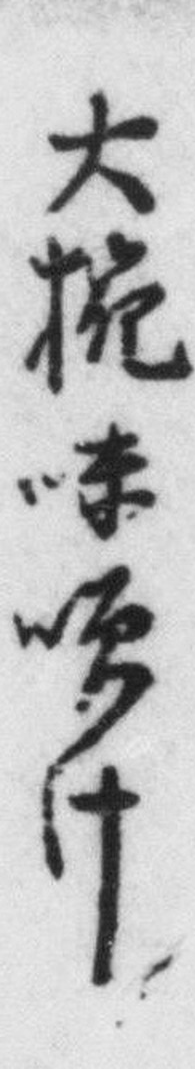大椀味噌汁
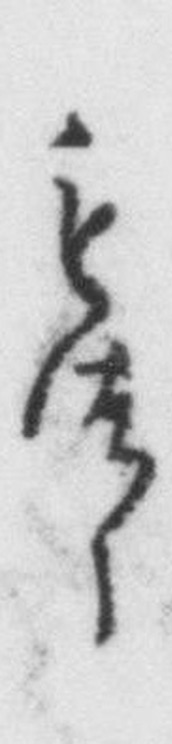もつく
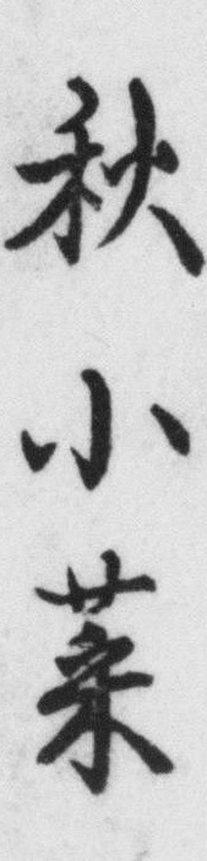秋小菜
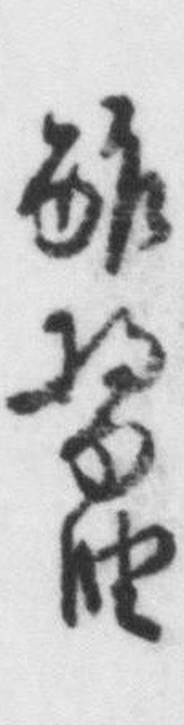酢醤油
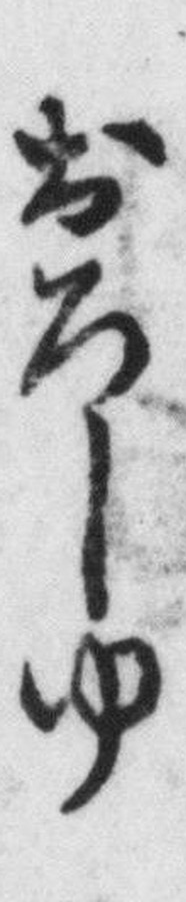おろしゆ
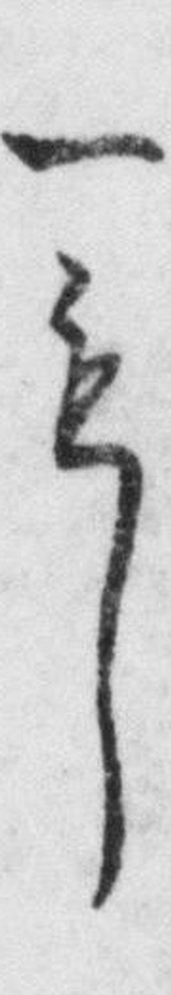一もし

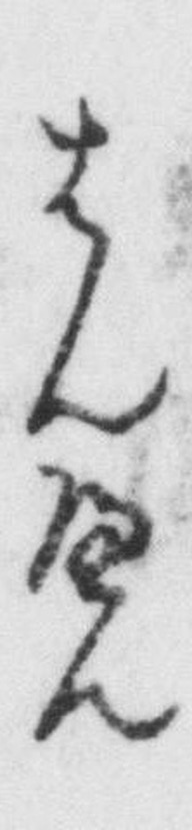はんへん
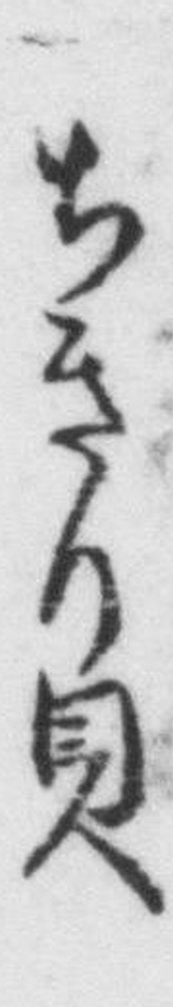ちきり貝
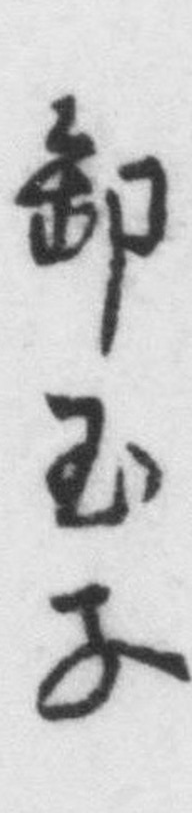卸玉子
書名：卓子料理仕様
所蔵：大阪府立大学学術情報センター 国文学研究資料館
